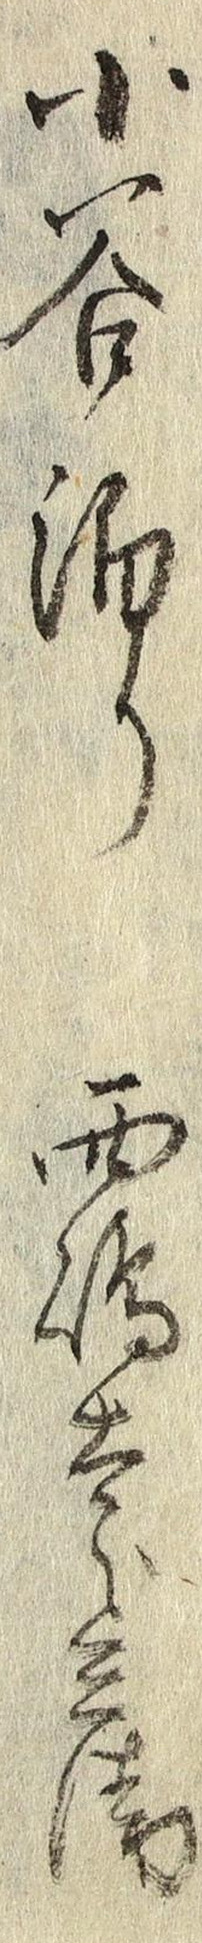小谷泊り西嶋太郎兵衛
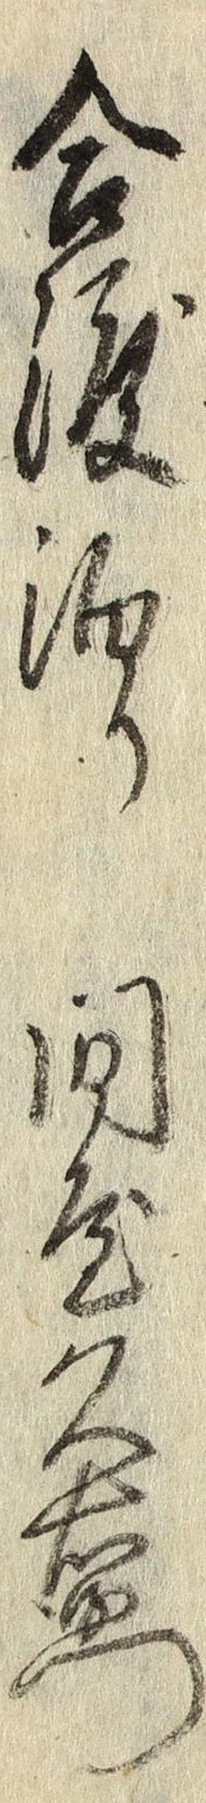合渡泊り問屋久右衛門
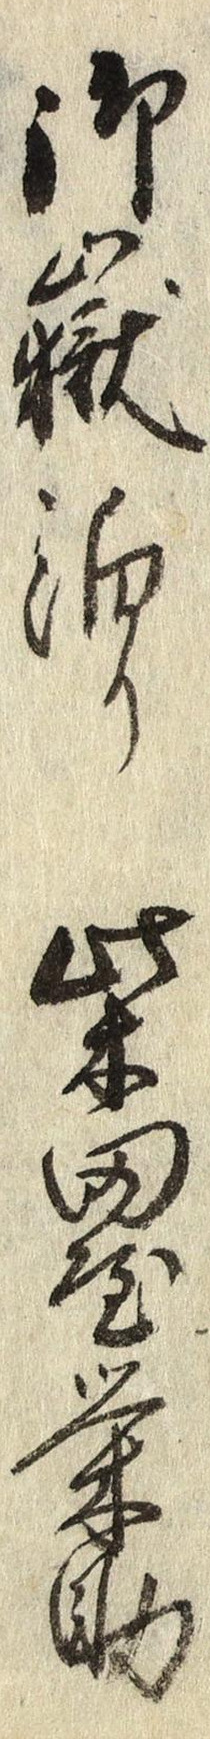御嶽泊り柴田屋栄助
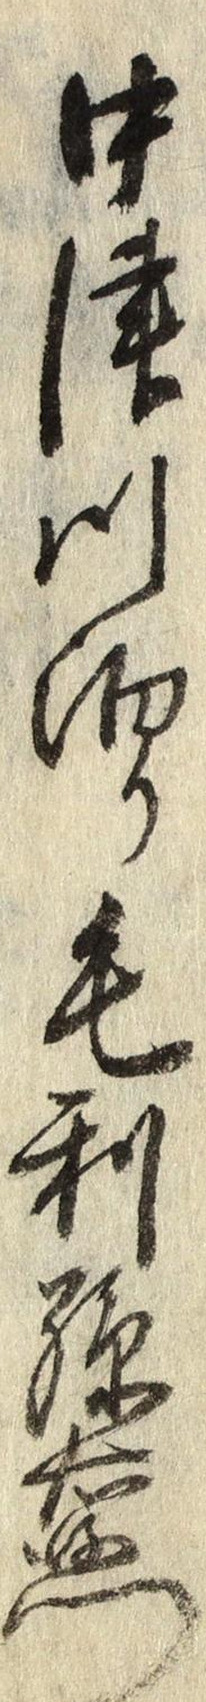中津川泊り毛利孫右衛門
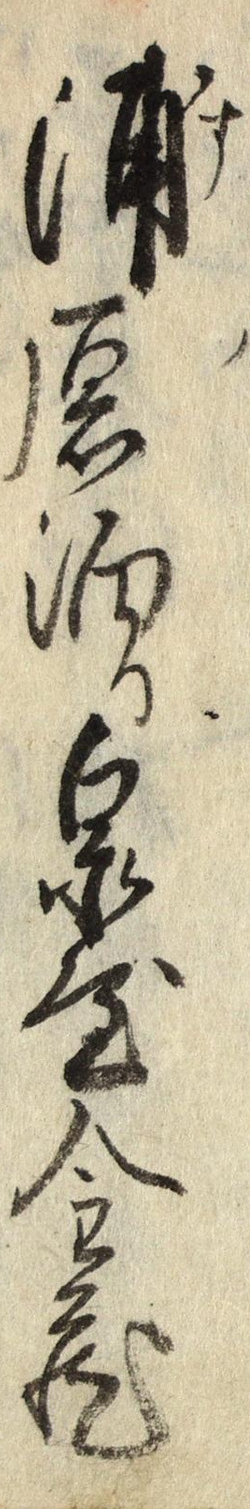浦原泊り泉屋金藏

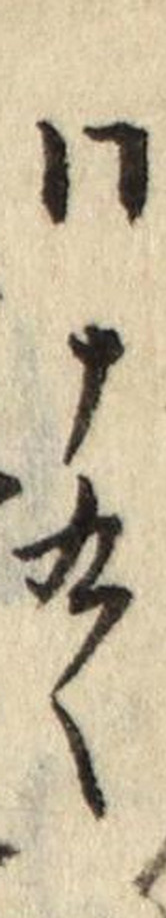同十九日
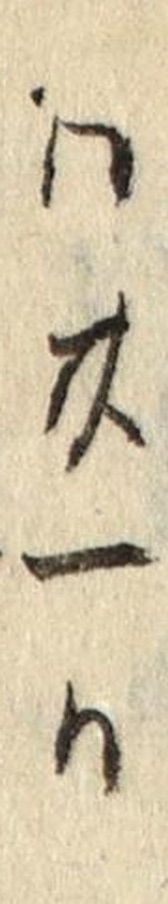同廿一日
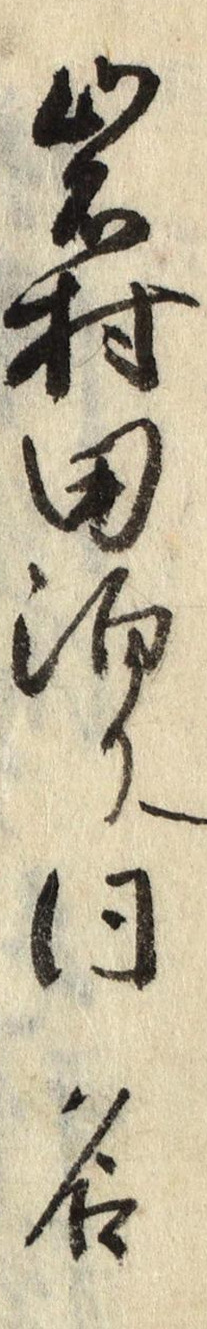岩村田泊り同名
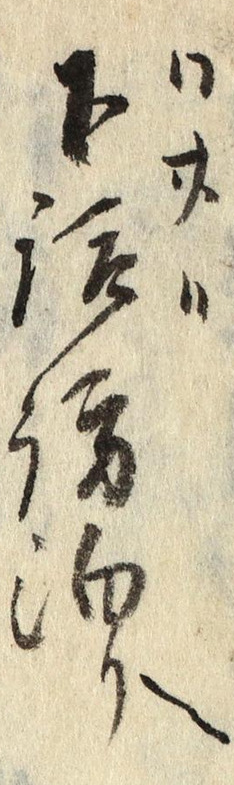下諏訪泊り
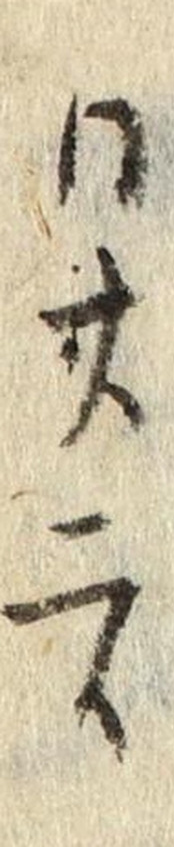同廿二日
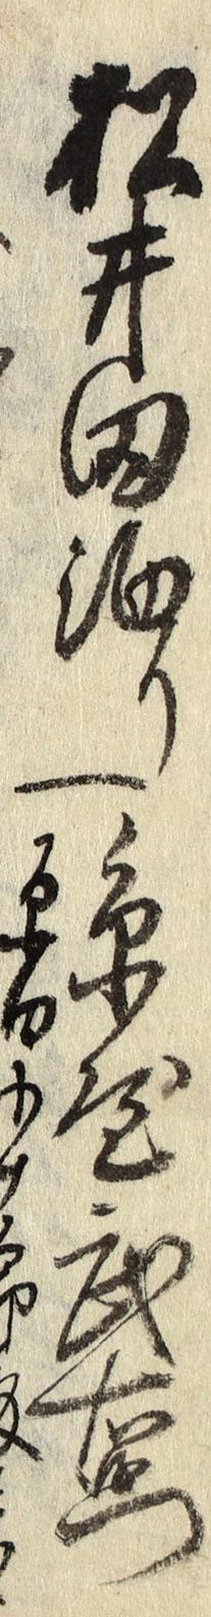松井田泊り糸屋武右衛門
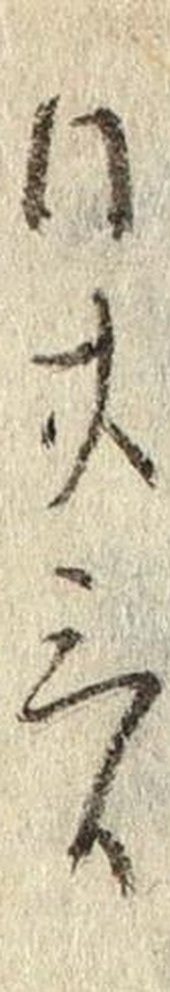同廿三日
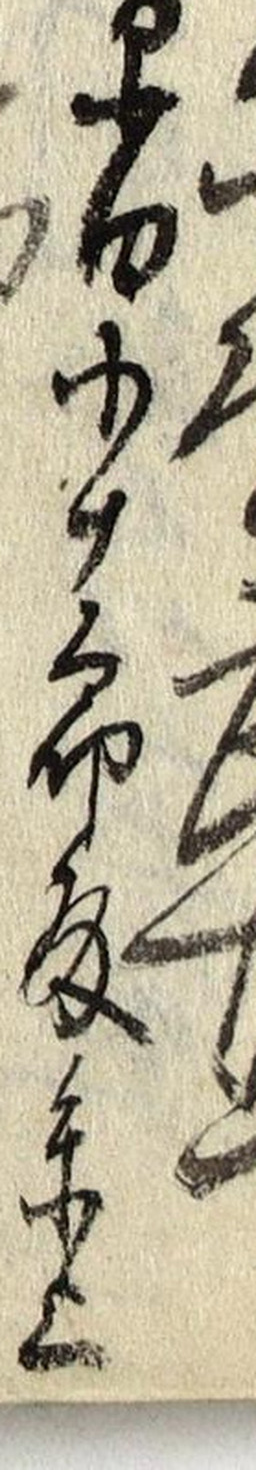原田小十郎殿参上
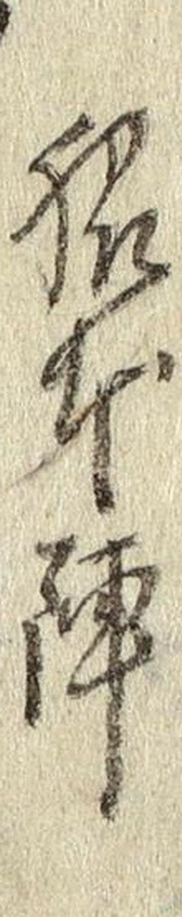脇本陣
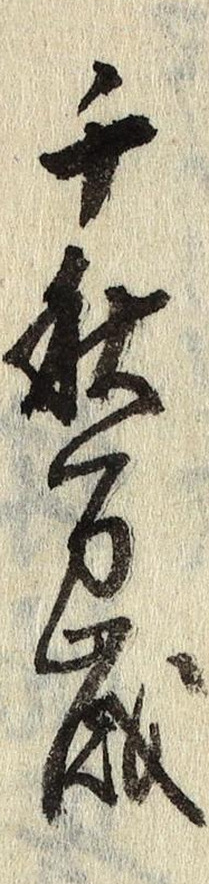千秋万歳
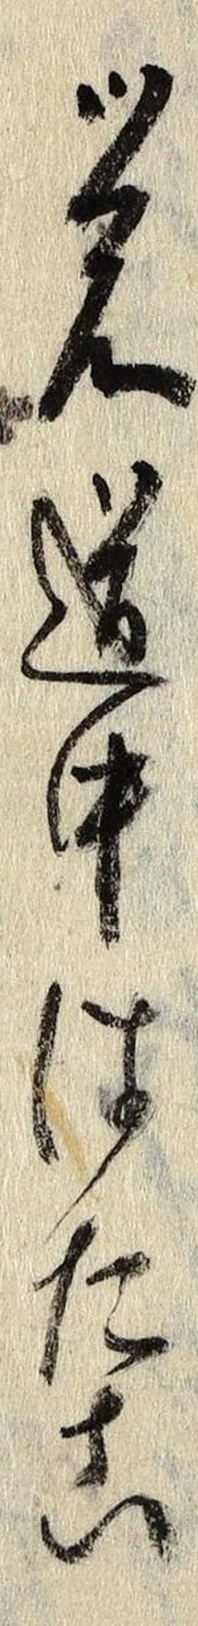覚道中はたこ
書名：中仙道道中覚
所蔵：福井県文書館 Fukui Prefectural Archives
